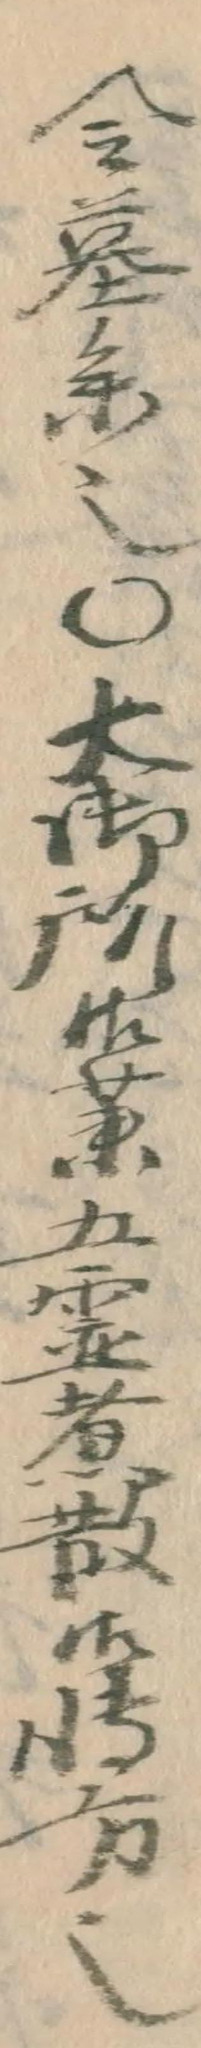令墓参也○大御所御薬五霊煮散御轉方也
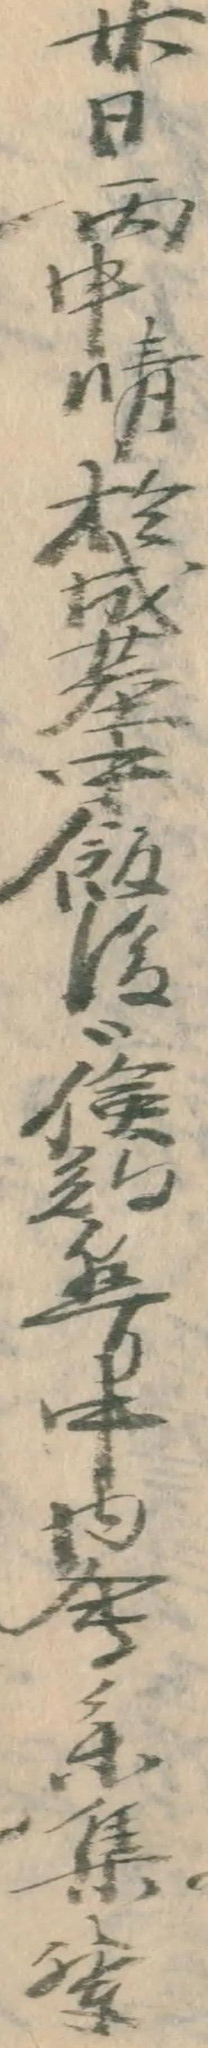廿日丙申晴於成基中飯後ハ倹約懸り中内會参集之輩
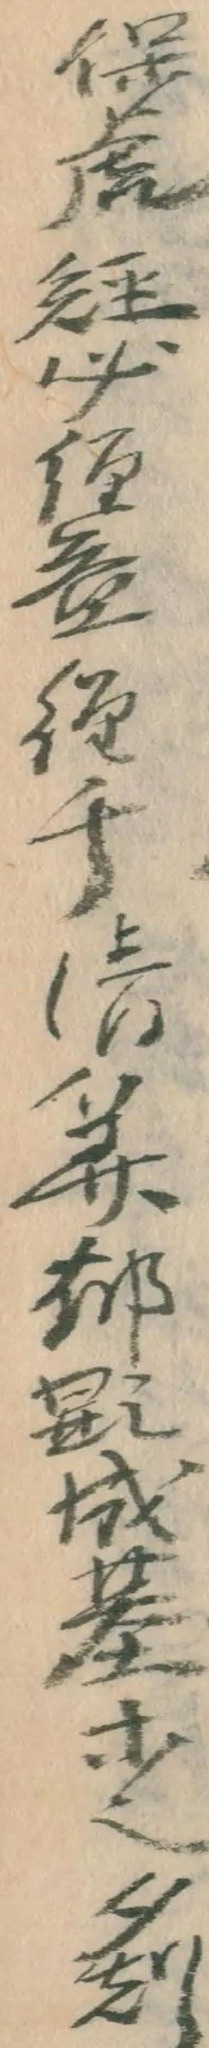保虎経必経益経千清算郁顕成基等也夕刻

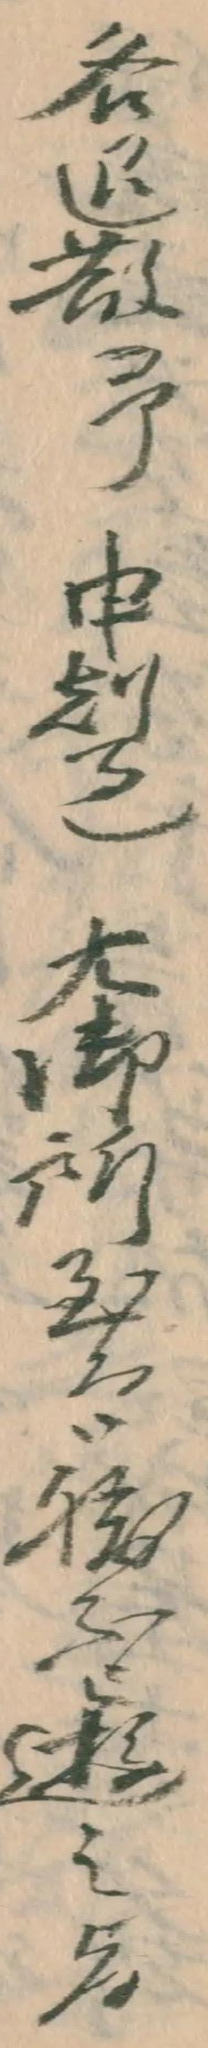各退散予申刻過大御所至而御勝不被遊之旨
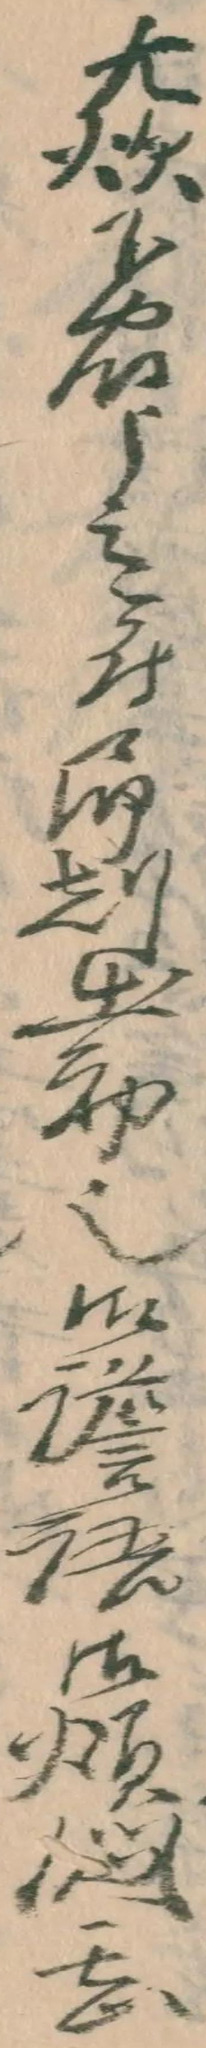尤炊下宿申之ニ付即刻出勤也御譫語御煩悶甚
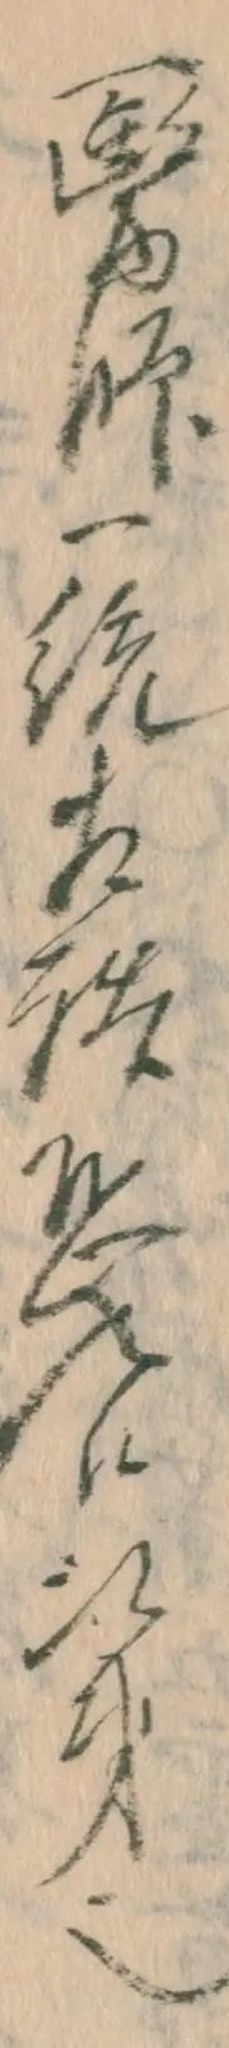醫師一統相談恐入候次第也
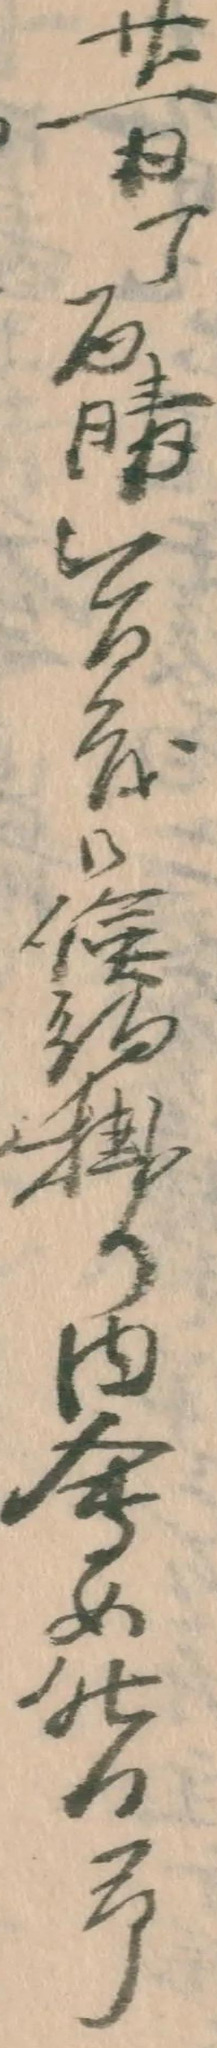廿一日丁酉晴今日も御倹約掛り内會如此日予
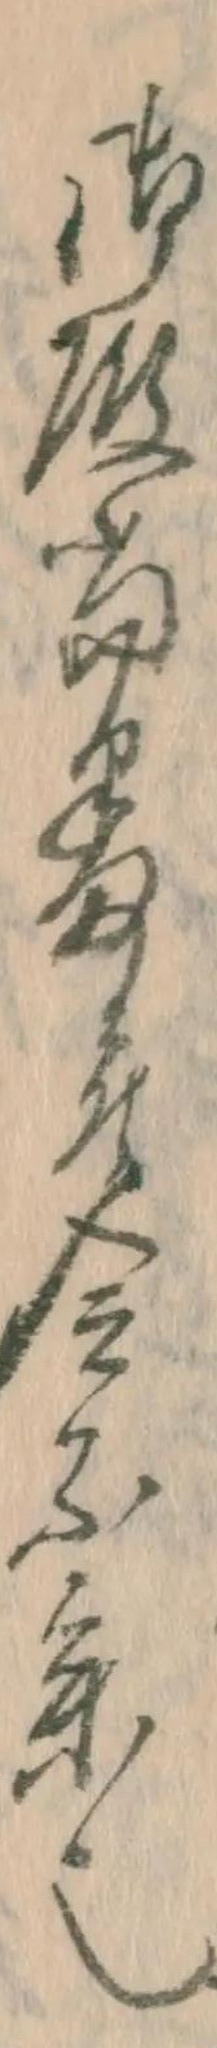御殿當番ニ付令不参也
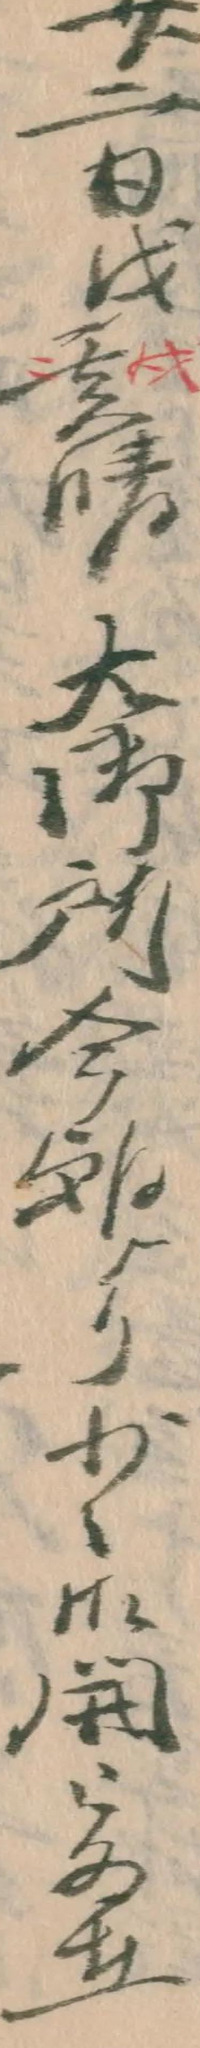廿二日戊亥晴大御所今朝より少々御開被為在
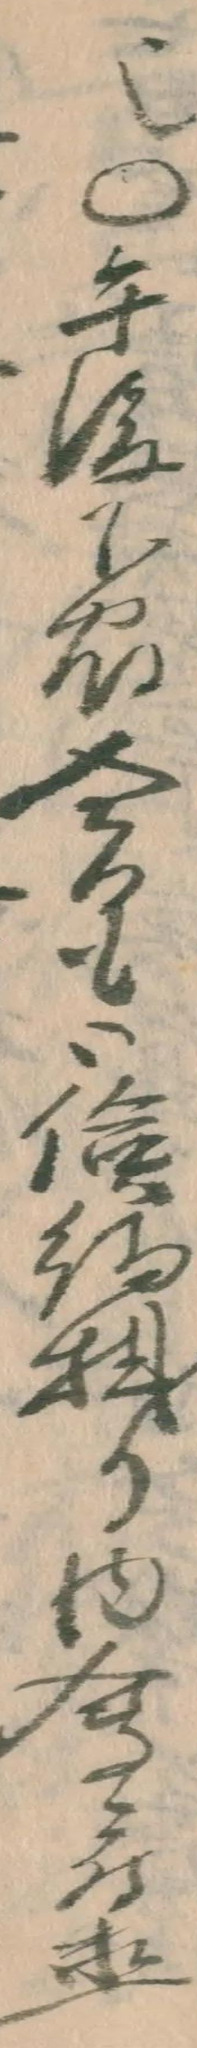也○午後下宿五日も御倹約掛り内會ニ付直
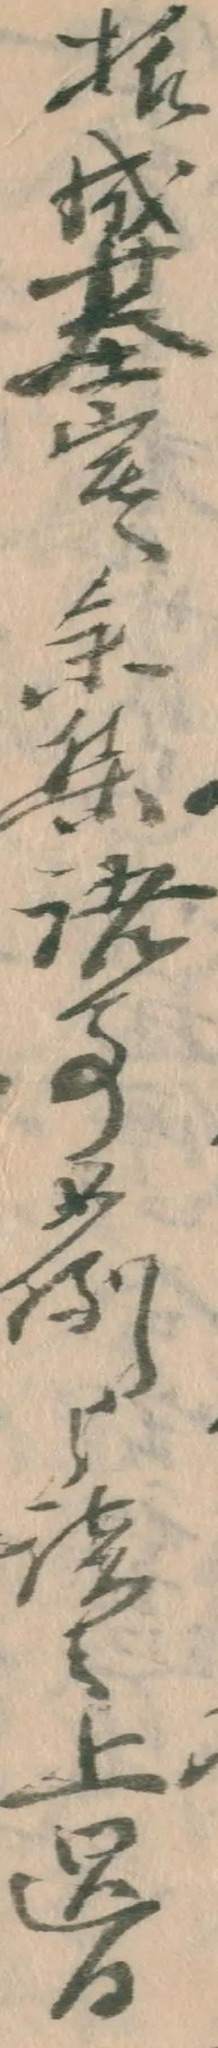様成基宅へ参集諸事如例申談之上過日
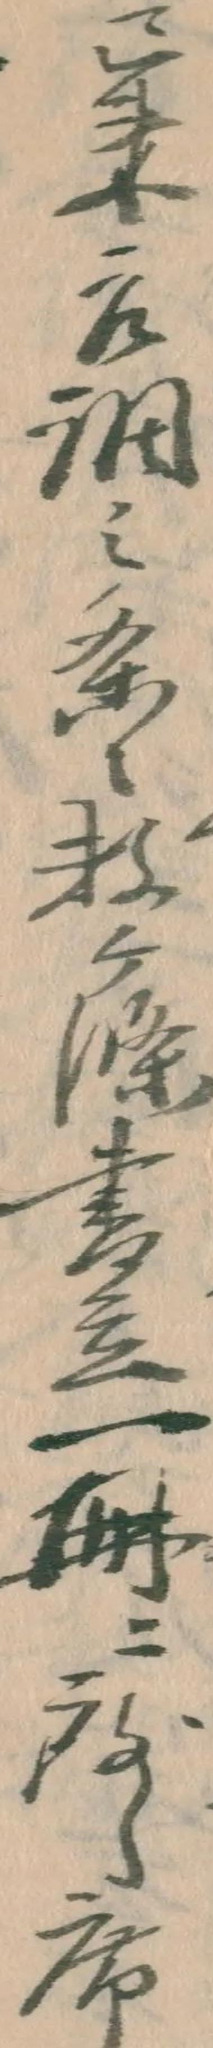已来取調之条々数ヶ條書立一冊ニ致し席
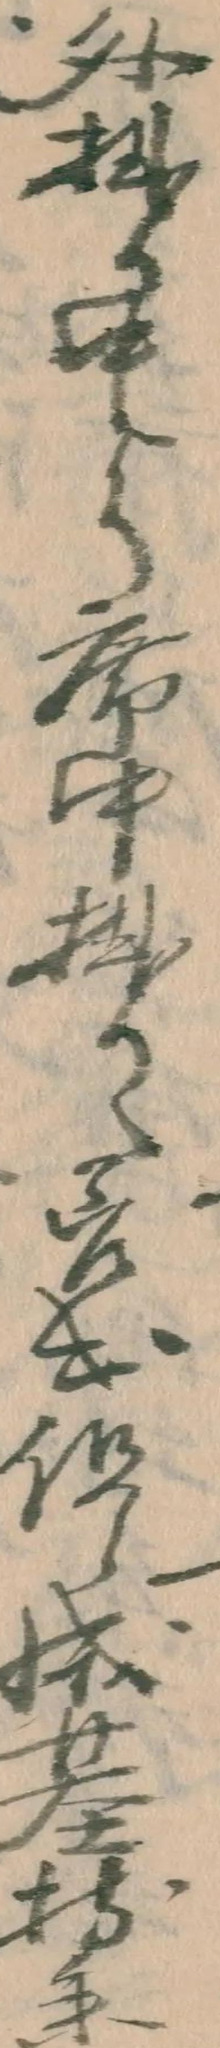外掛り中より席中掛りへ差出但し成基持参
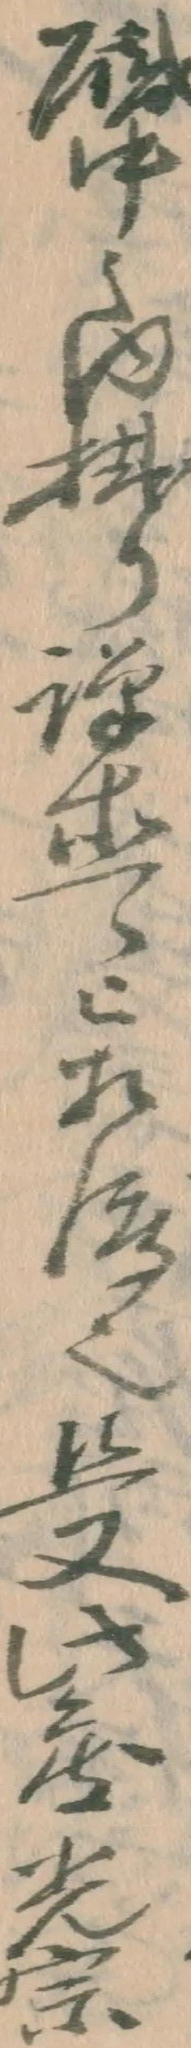職中之内掛り謹直可被相渡也且又此度光宗
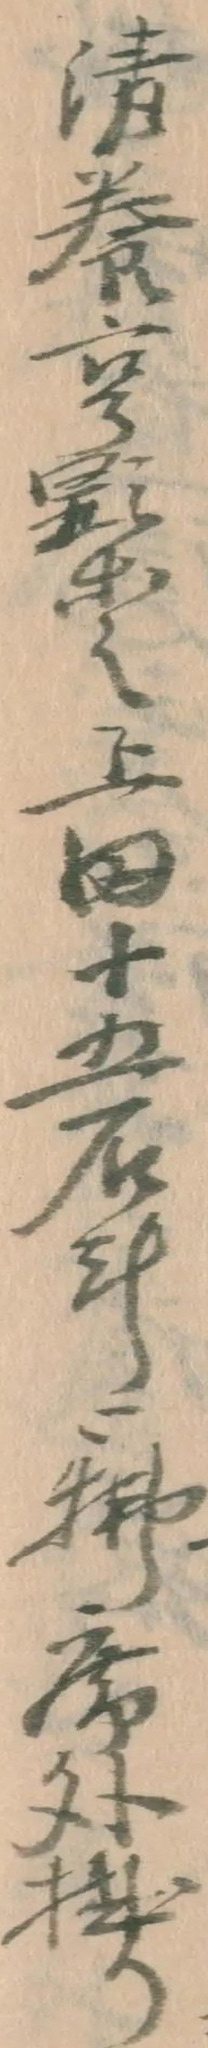清養亨顕等之上田十五石斗御払席外掛り
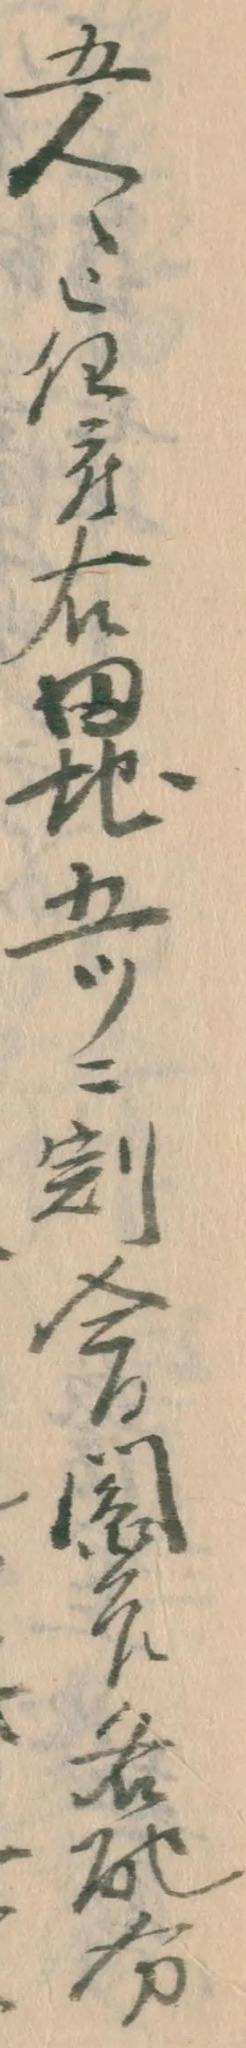五人へ被任ニ付右田地五ツニ割強鬮取各配分
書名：賀茂社記録. 第67冊
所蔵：国立国会図書館 National Diet Library, JAPAN
